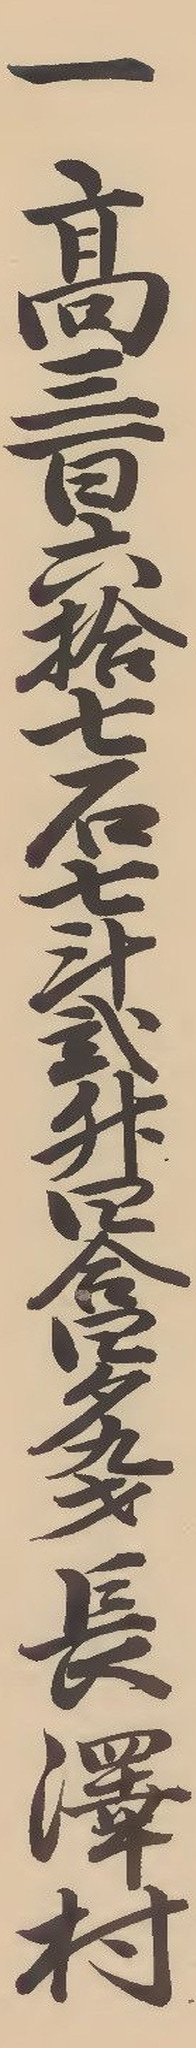一高三百六拾七石七斗弐升四合四勺九才長沢村

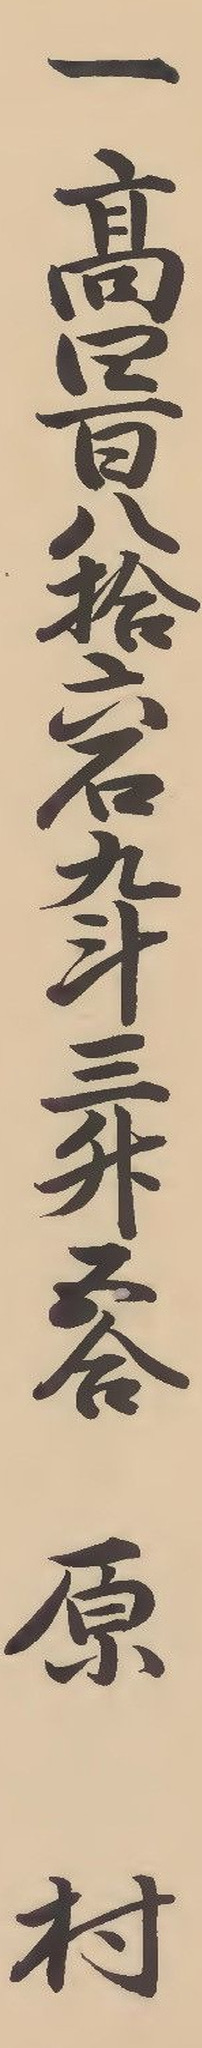一高四百八拾六石九斗三升五合原村
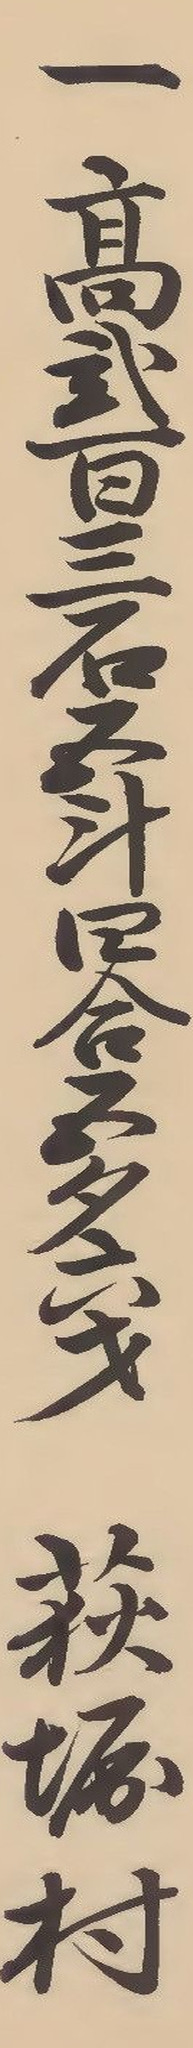一高弐百三石五斗四合五勺六才荻堀村
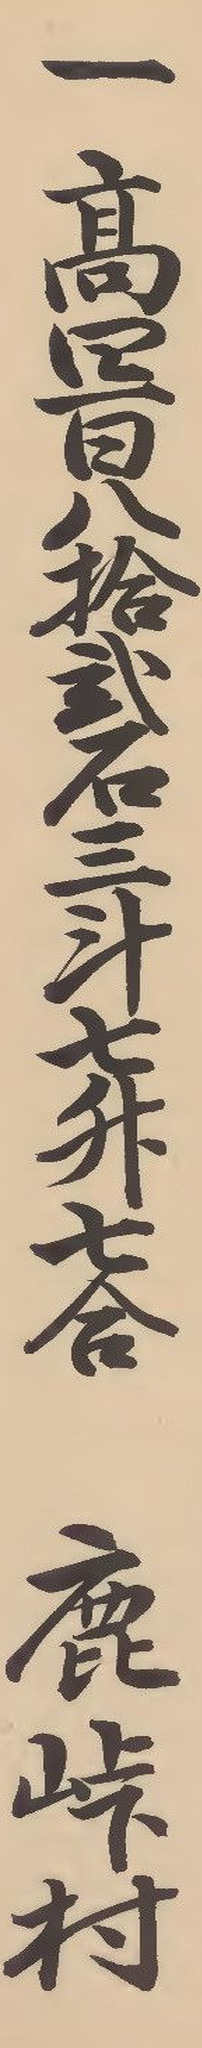一高四百八拾弐石三斗七升七合鹿峠村
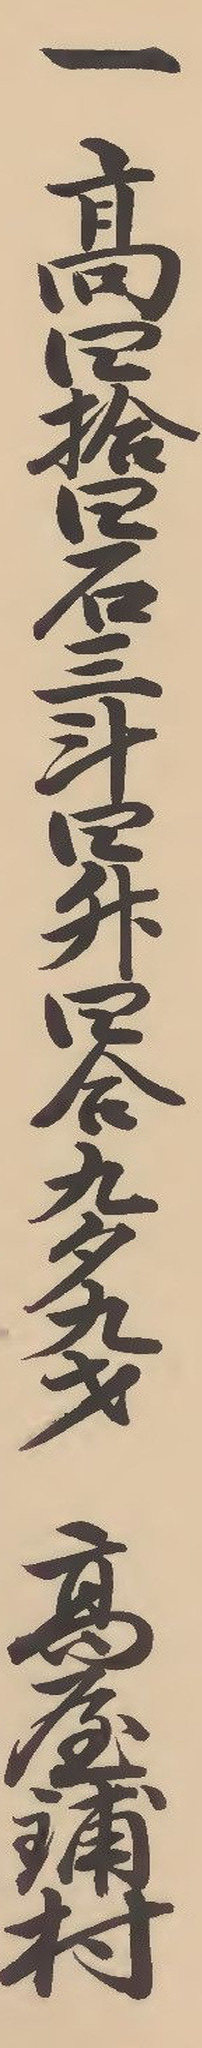一高四拾四石三斗四升四合九勺九才高屋鋪村
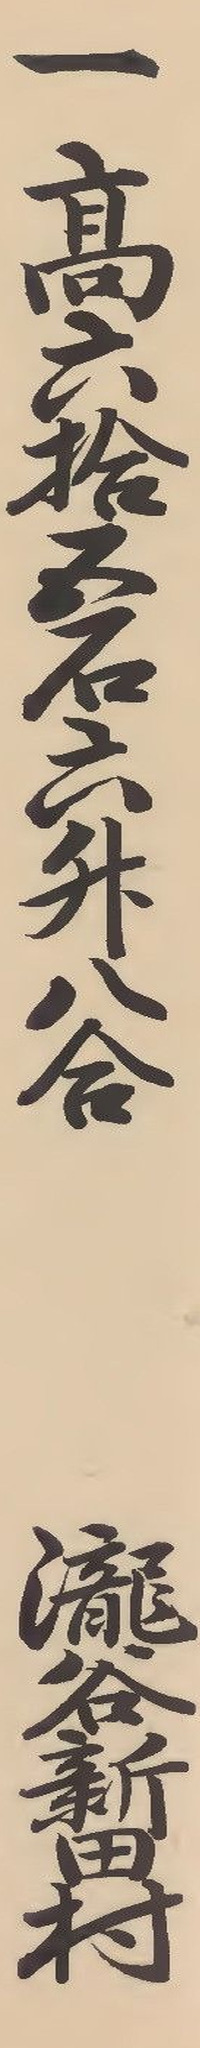一高六拾五石六升八合滝谷新田村
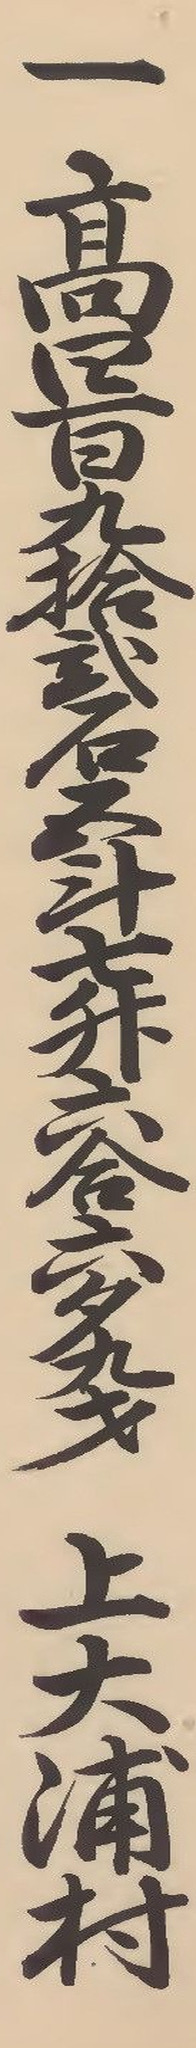一高四百九拾弐石五斗七升六合六勺九才上大浦村
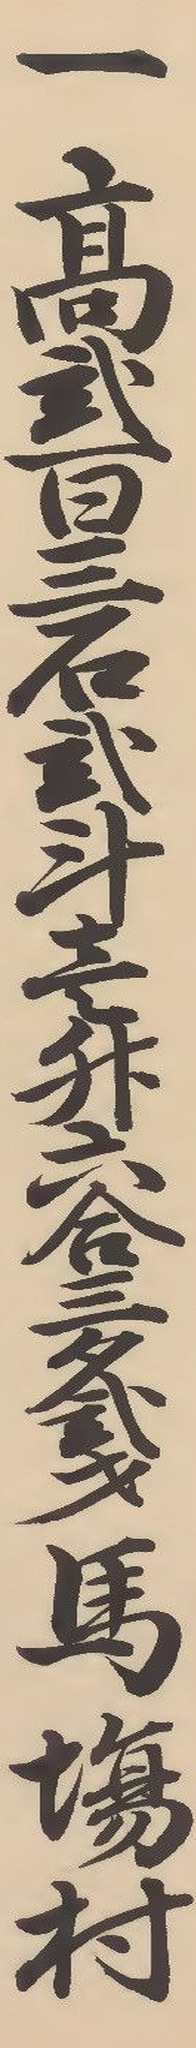一高弐百三石弐斗壱升六合三勺二才馬場村
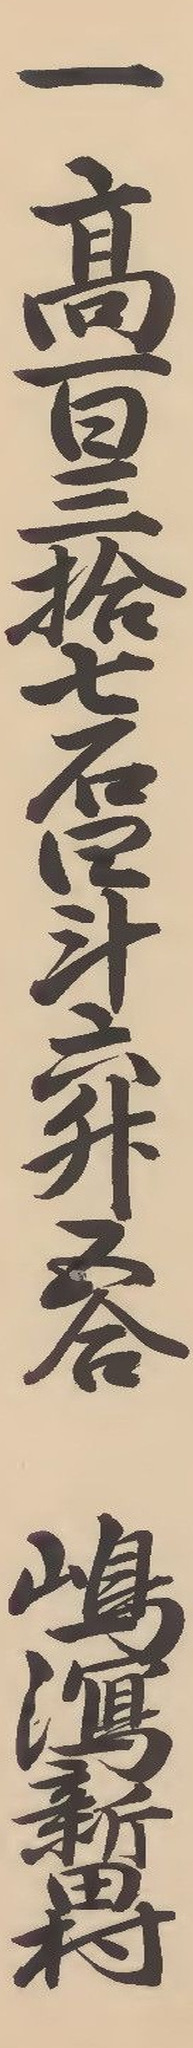一高百三拾七石四斗六升五合島潟新田村

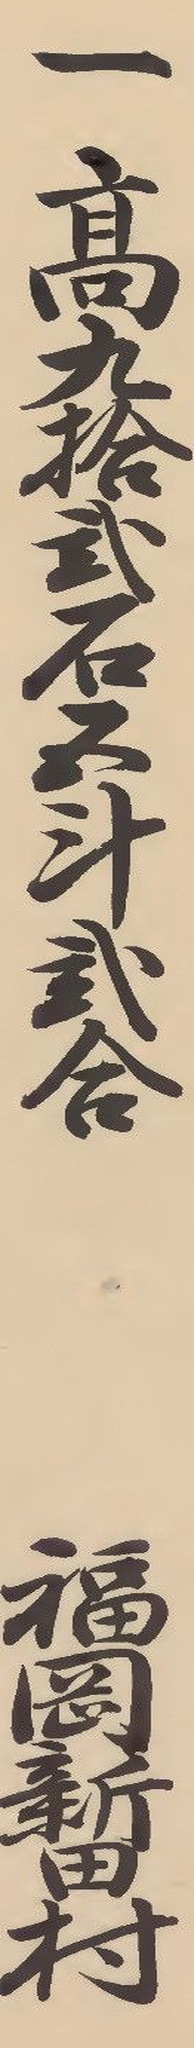一高九拾弐石五斗弐合福岡新田村
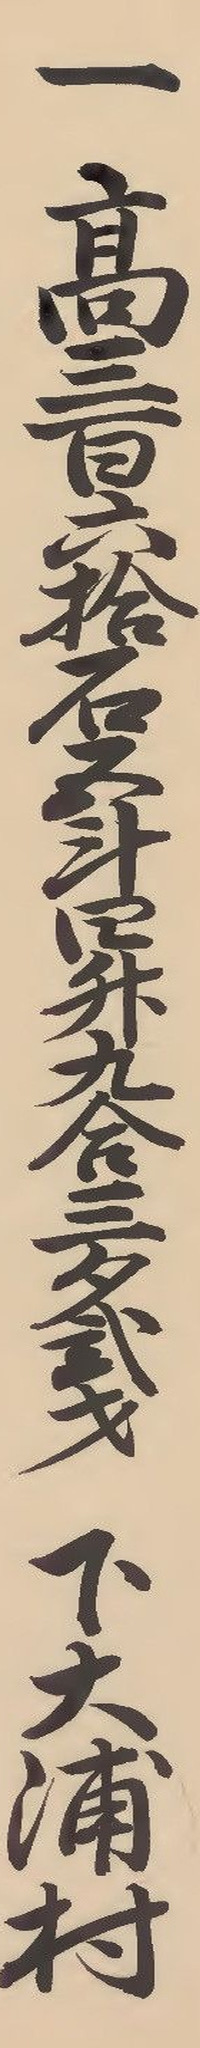一高三百六拾石五斗四升九合三勺弐才下大浦村
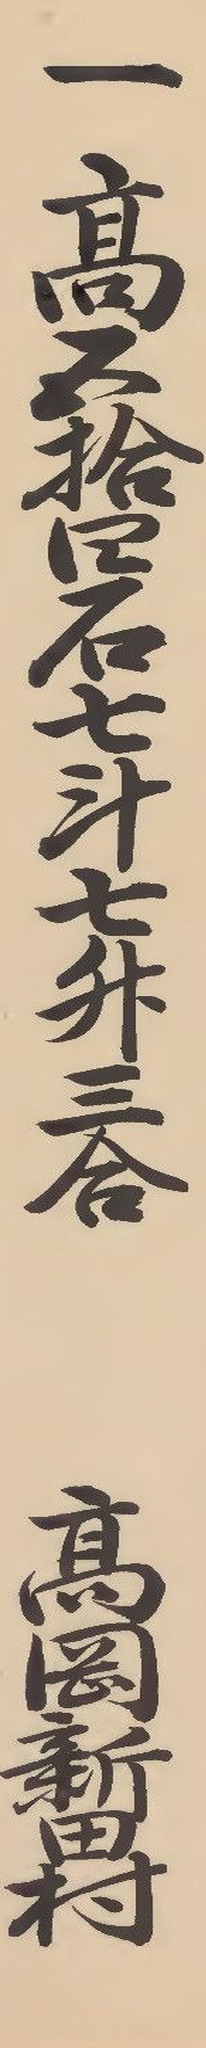一高五拾四石七斗七升三合高岡新田村
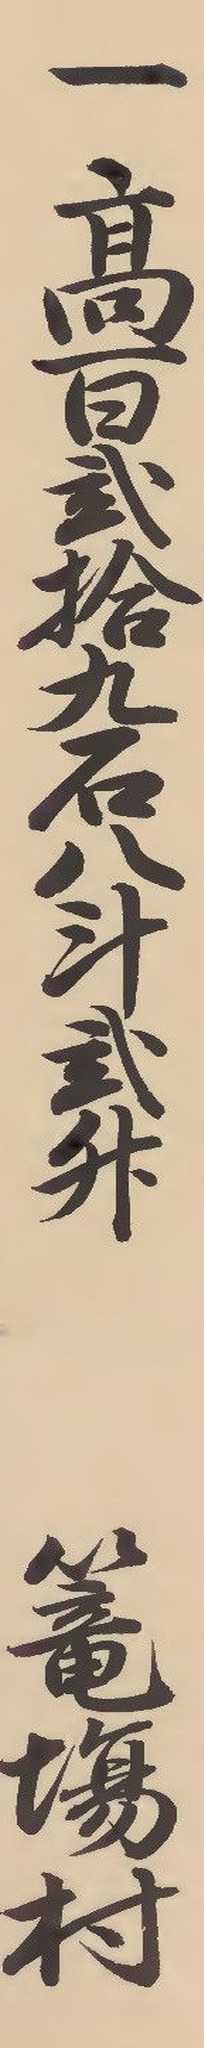一高百弐拾九石八斗弐升篭場村
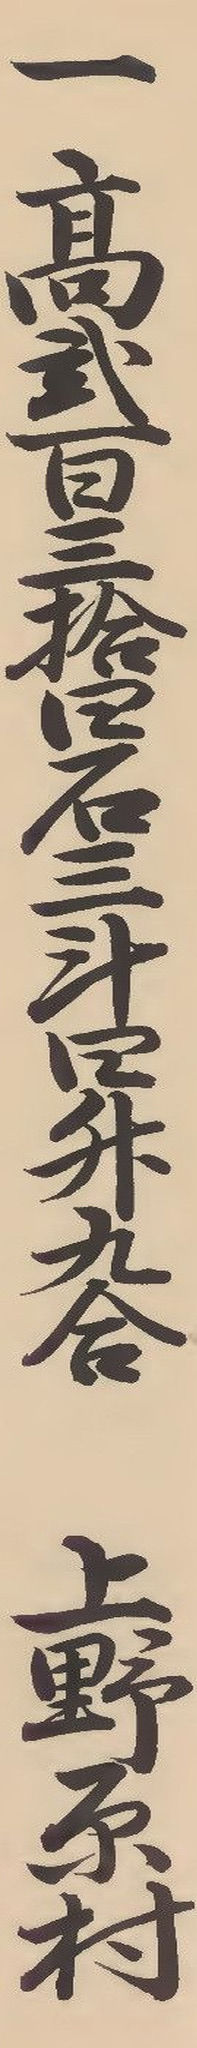一高弐百三拾四石三斗四升九合上野原村
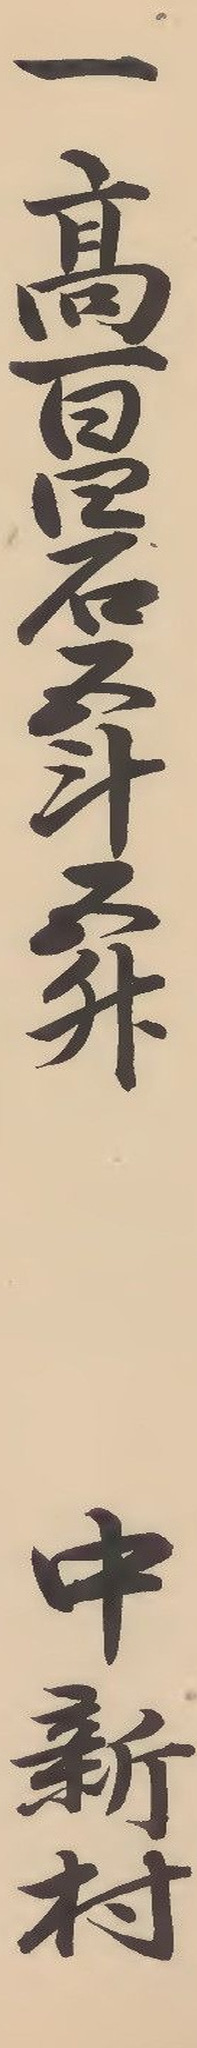一高百四石五斗五升中新村
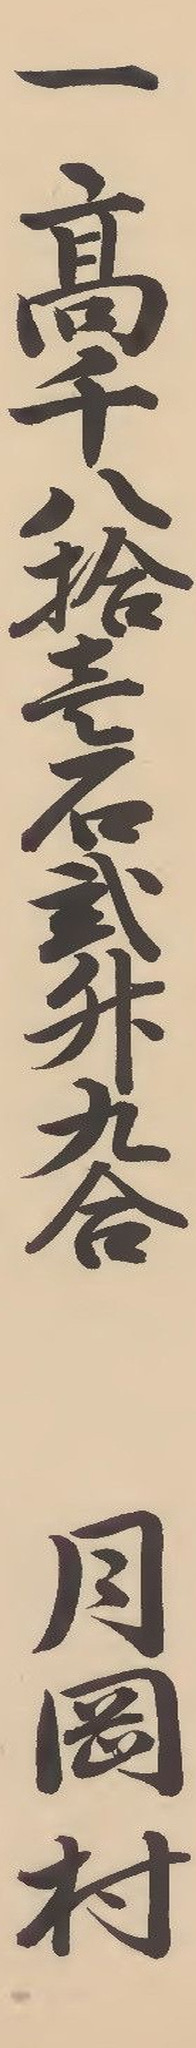一高千八拾壱石弐升九合月岡村
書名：越後国郷帳　下
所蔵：国立公文書館 National Archives of Japan
